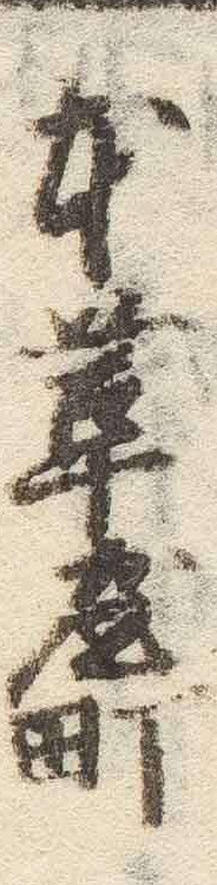本革屋町
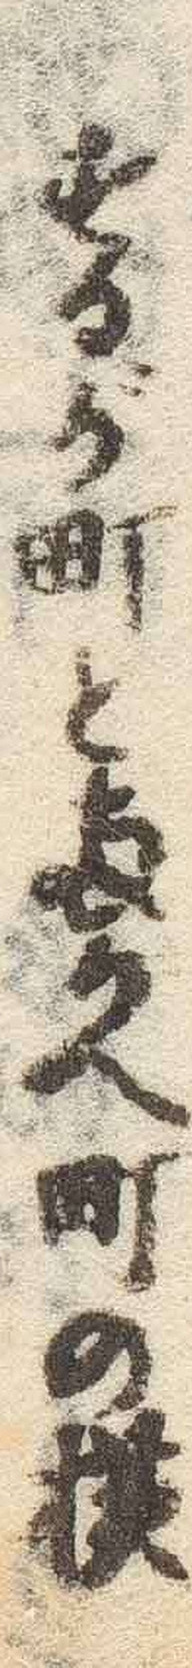するが町と両かへ町の横
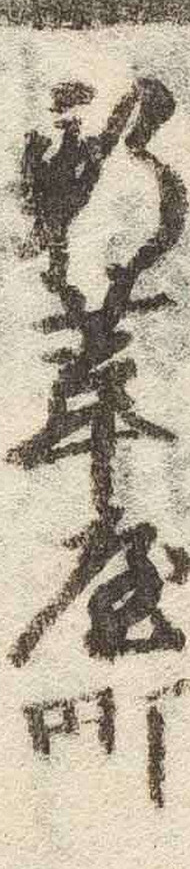新革屋町
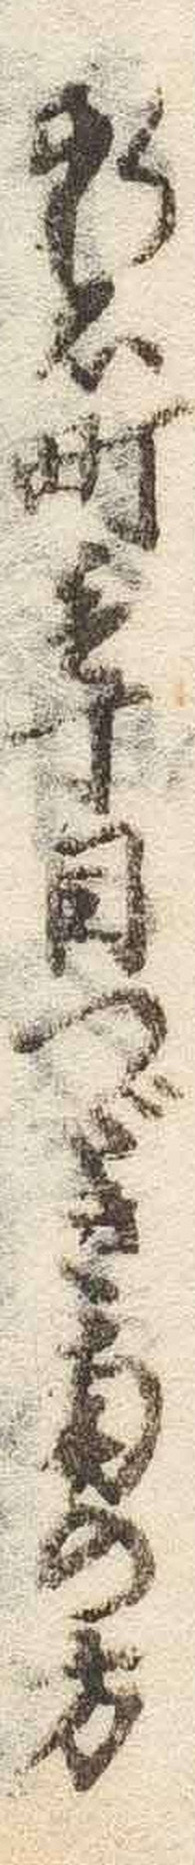新石町壱丁目つゞき南の方
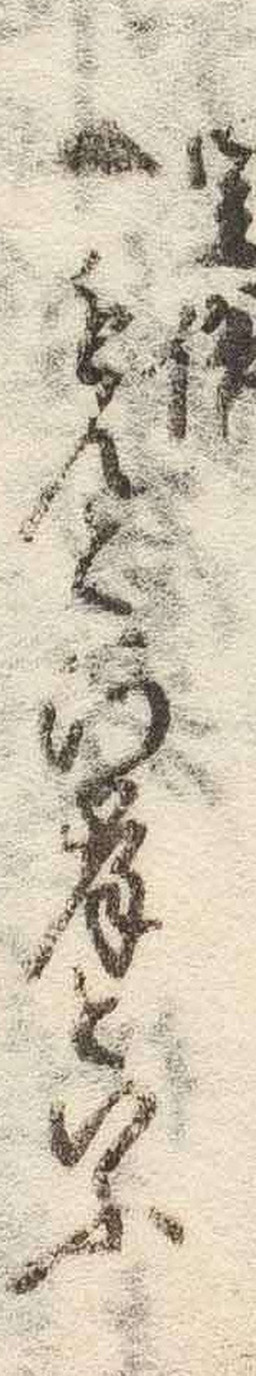▲もんと河岸といふ
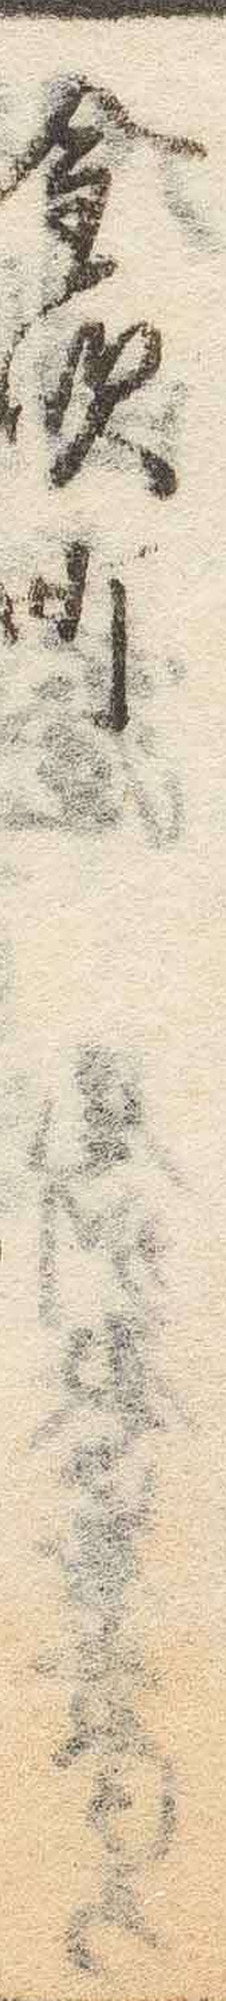金吹町
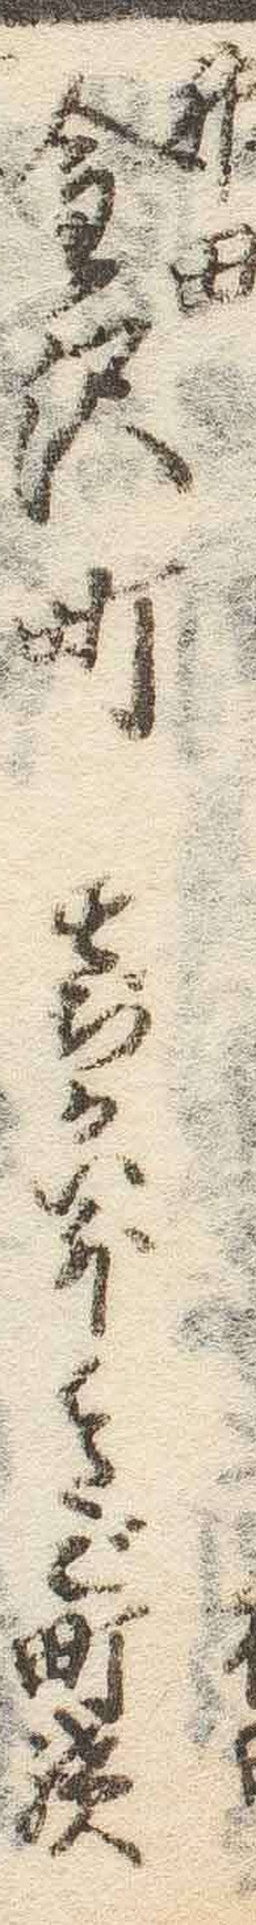金沢町すぢかい外はたご町続
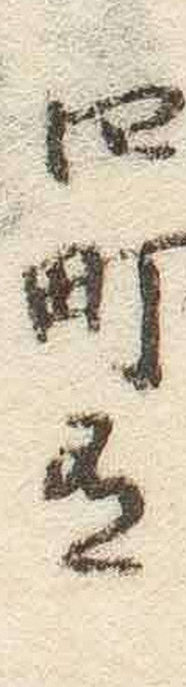四町有
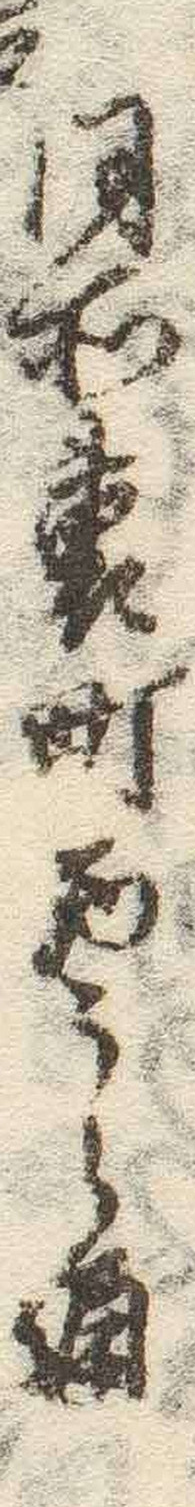同所裏町西うら通
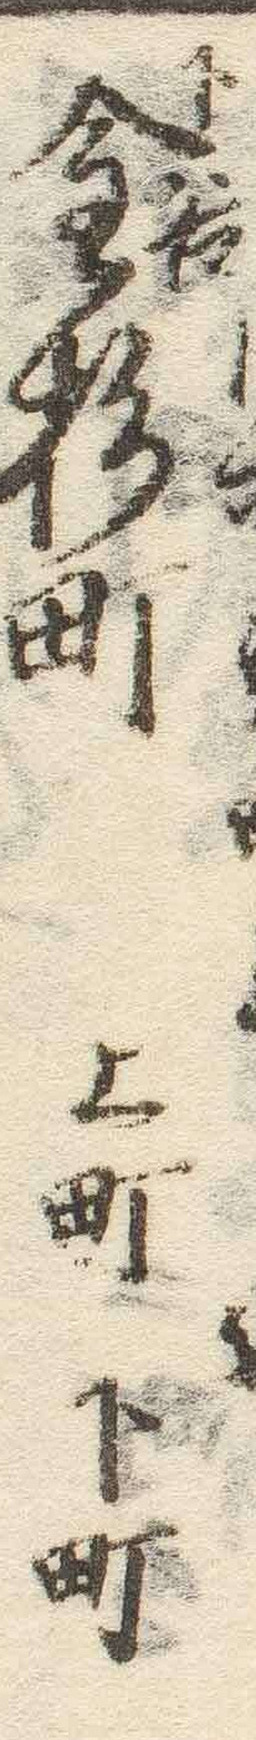金杉町上町下町
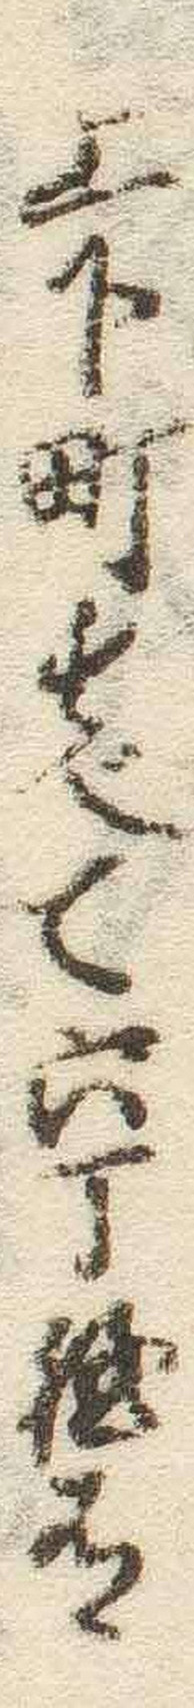上下町すべて六町程有
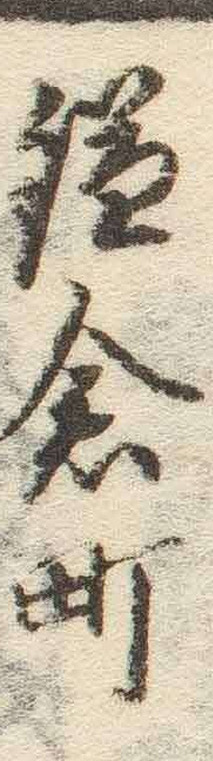鎌倉町
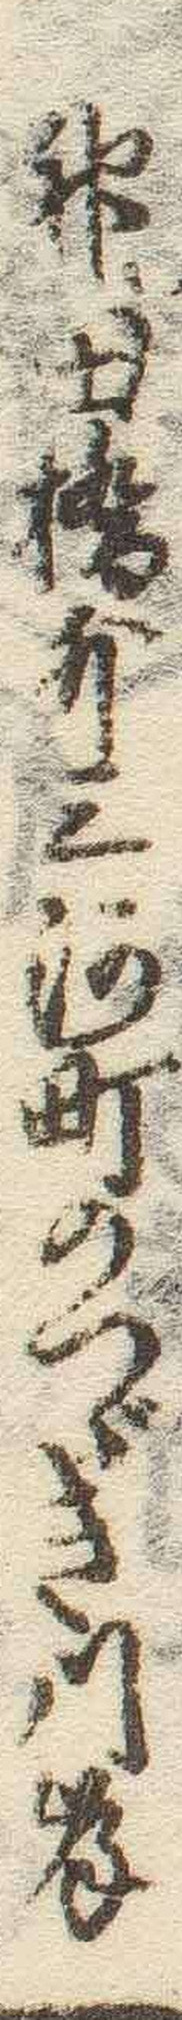神田橋外三河町のつゞき川岸
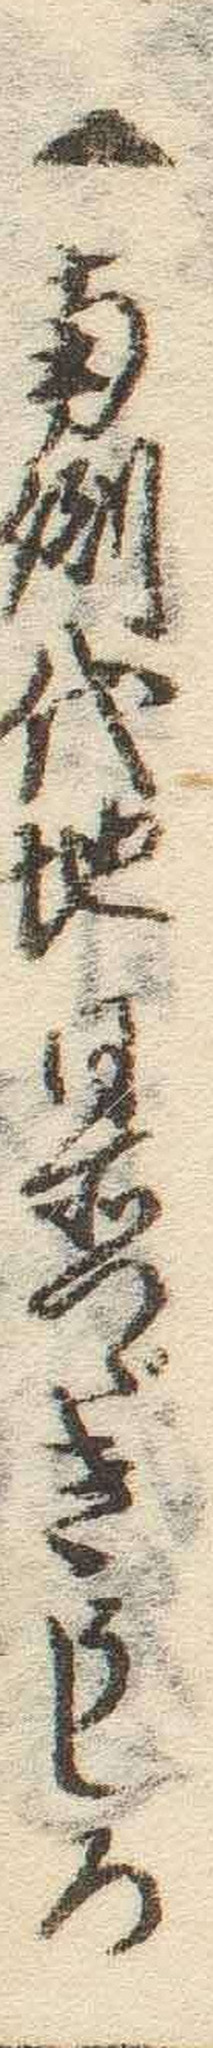▲南側代地同所つゞきうしろ
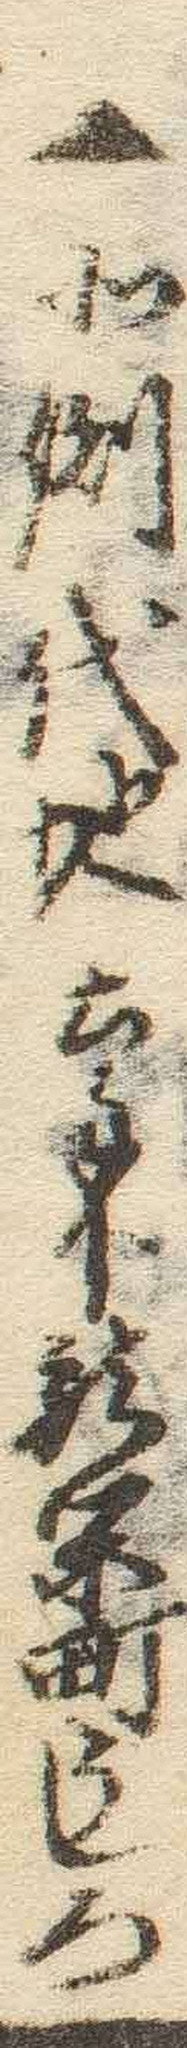▲北側代地土手下龍閑町うしろ
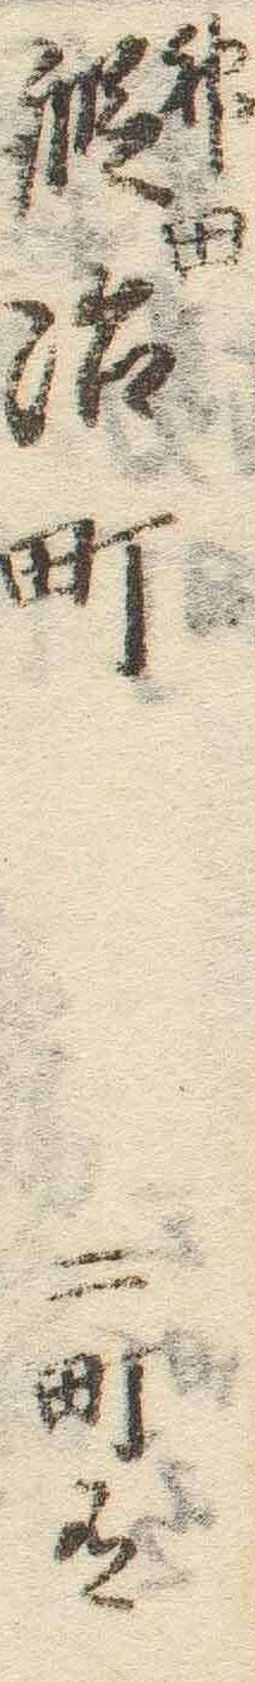鍛冶町二町有
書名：江戸町独案内
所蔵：東京学芸大学附属図書館 国文学研究資料館
